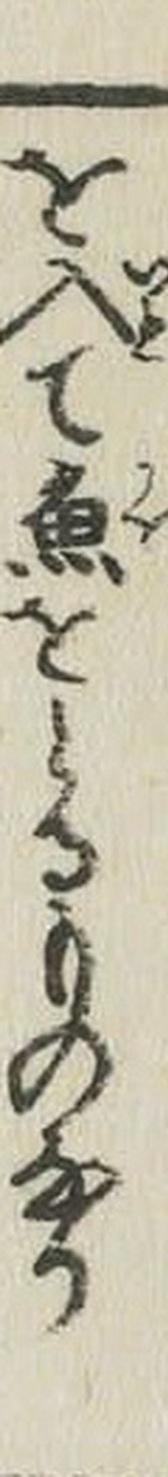を入て魚をとるものなり
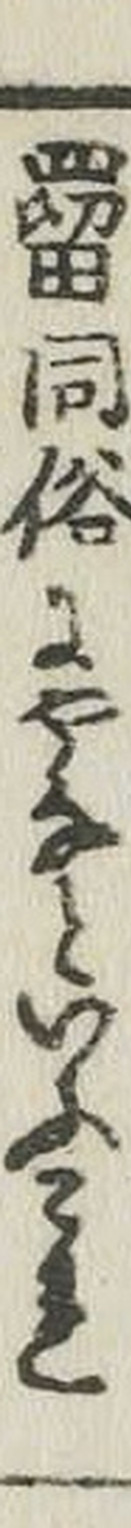罶同俗にやなといふこれ
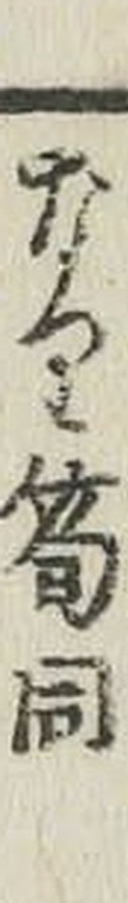なり筍同
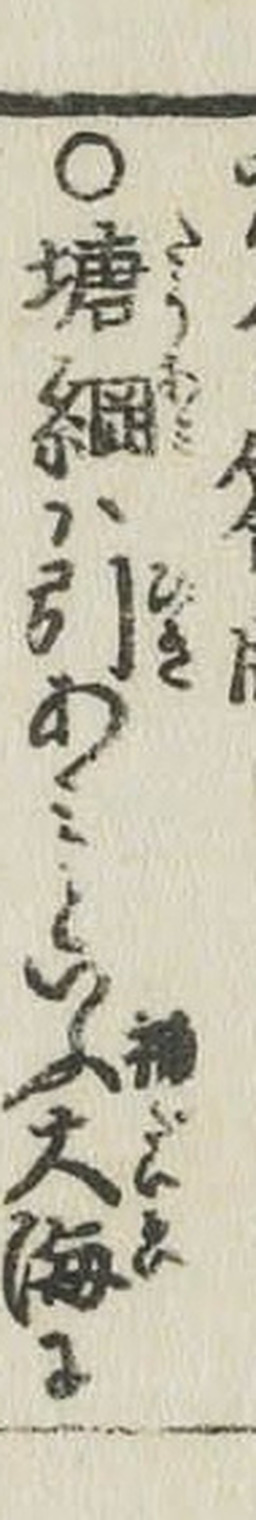○塘網は引あみといふ大海に
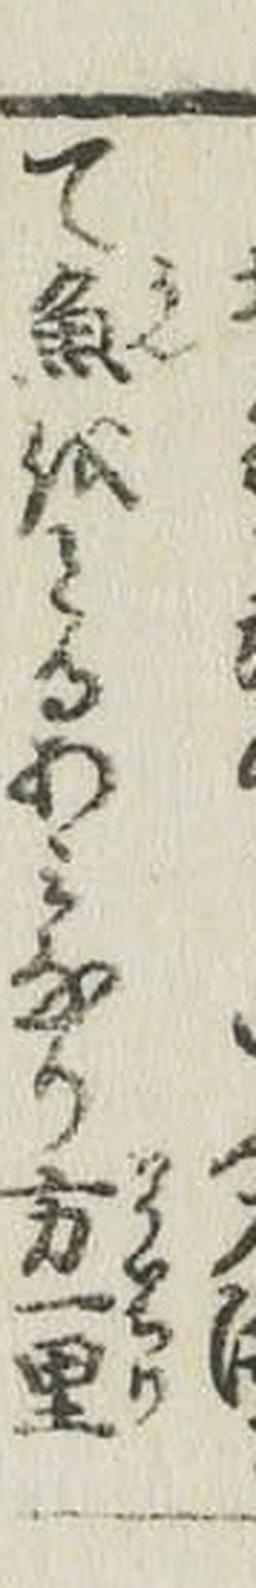て魚をとるあみなり方一里
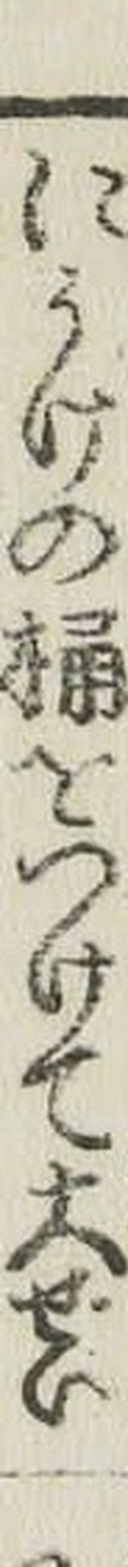にうけの桶をつけて大ぜい
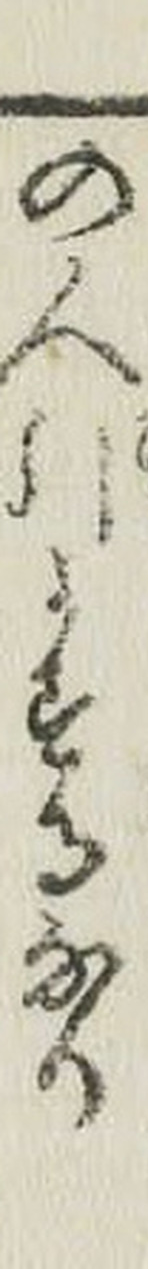の人引よするなり
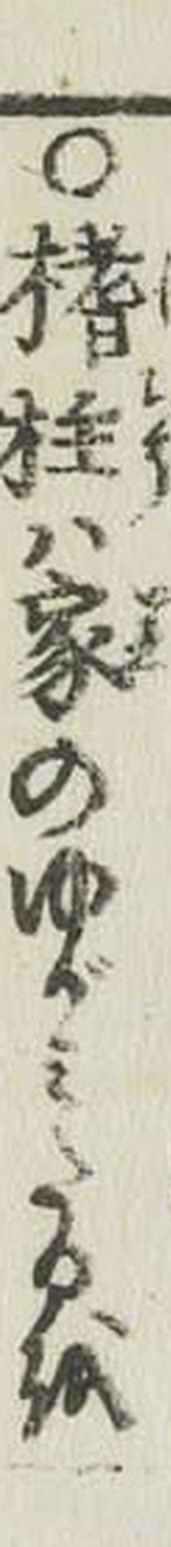○榰柱は家のゆがみたるを
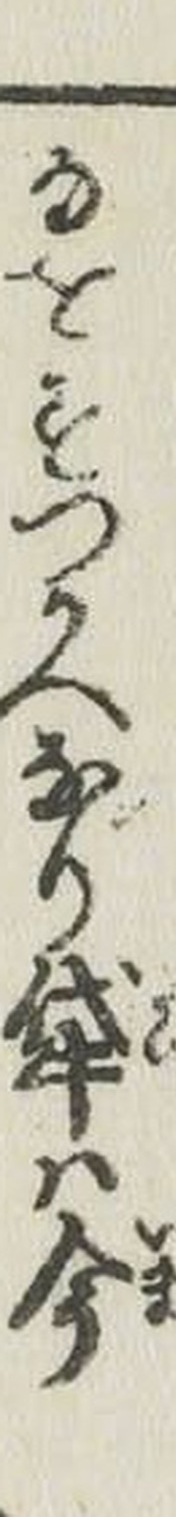なをすつかへなり牮は今
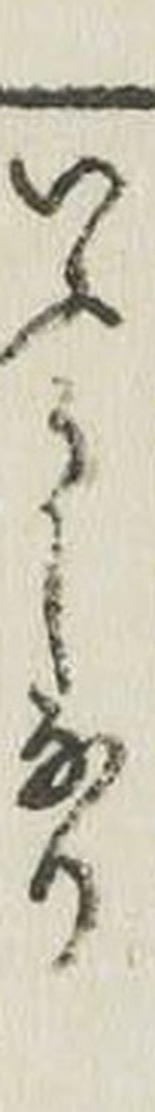いふうしなり
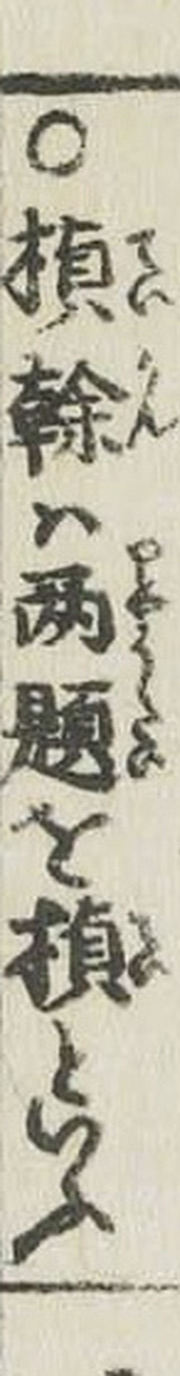○楨幹は両題を楨といふ
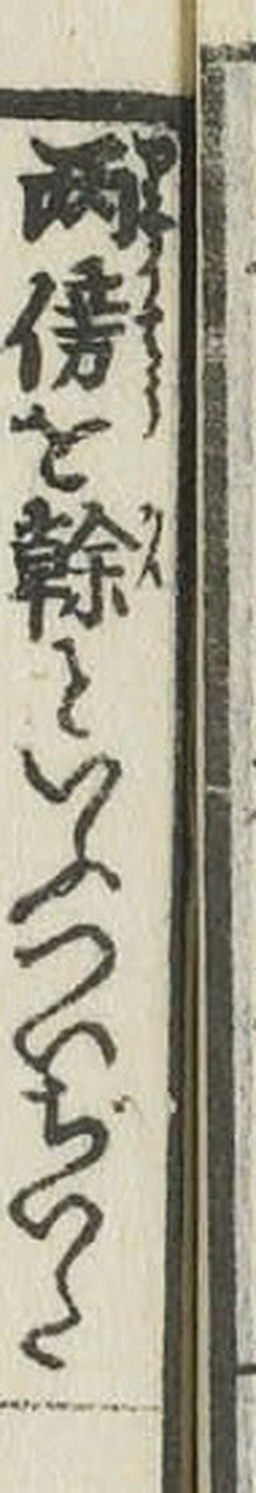両傍を幹といふついぢいた
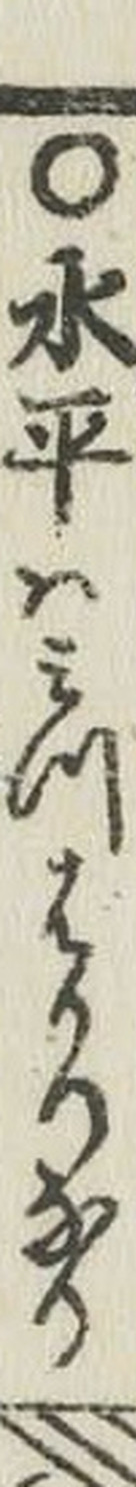○水平はみつはかりなり
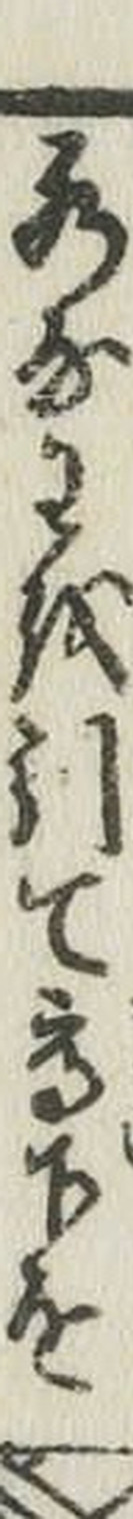水なわを引て高下を
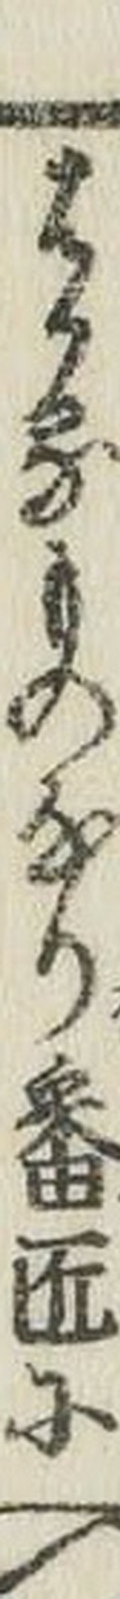はかるものなり番匠に
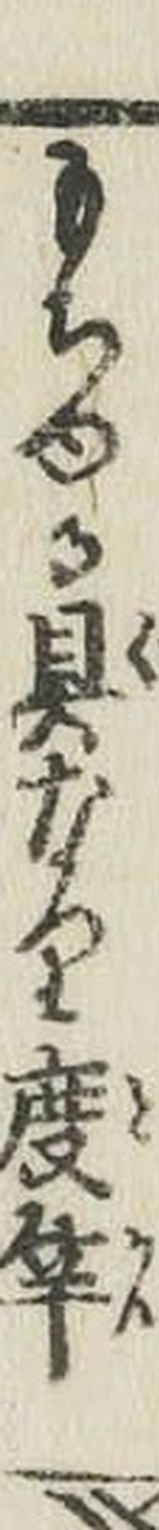もちゆる具なり度竿
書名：増補頭書訓蒙図彙大成 10巻 5:巻之9-11
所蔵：東京学芸大学教育コンテンツアーカイブ
